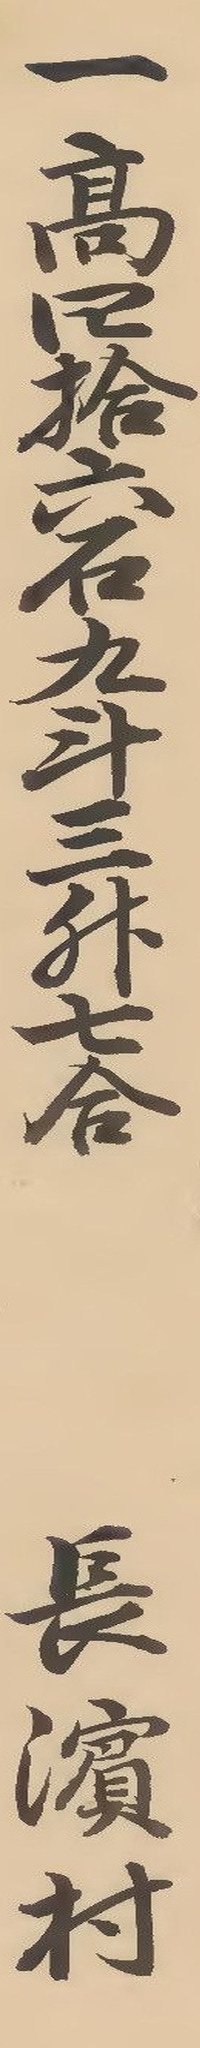一高四拾六石九斗三升七合長浜村
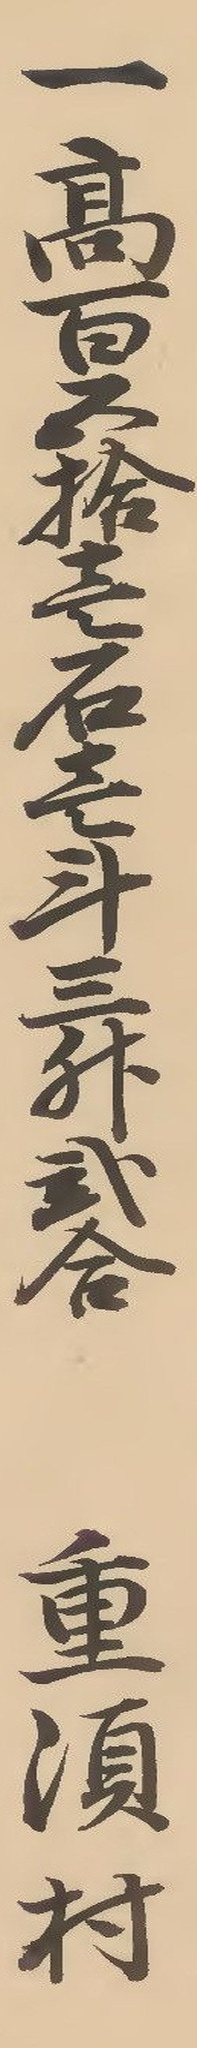一高百五拾壱石壱斗三升弐合重須村
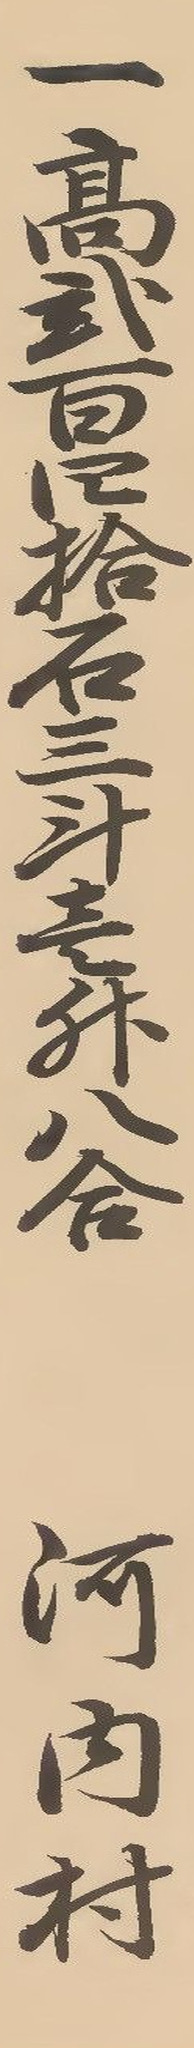一高弐百四拾石三斗壱升八合河内村
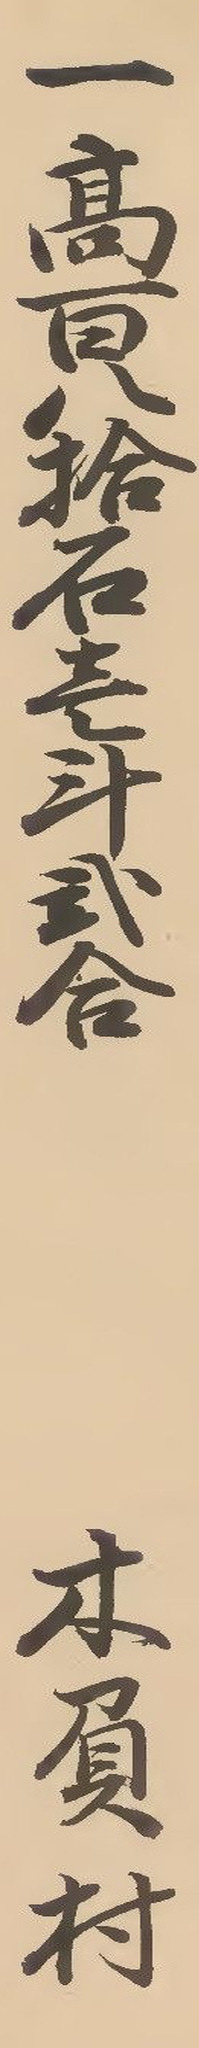一高百八拾石壱斗弐合木負村
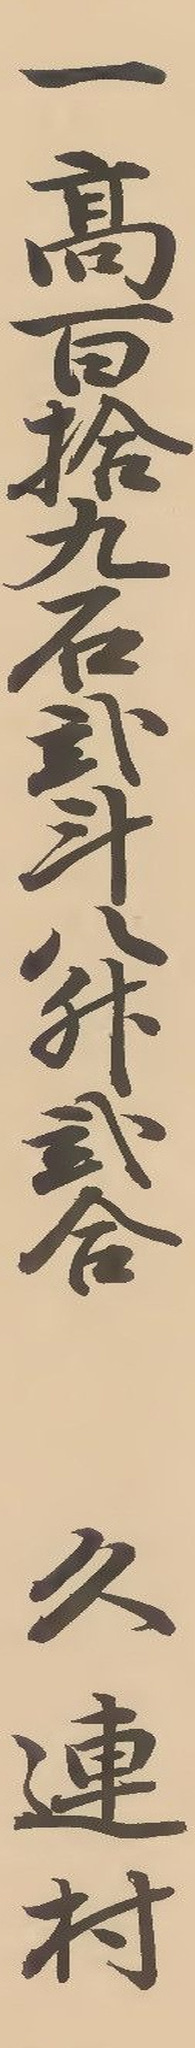一高百拾九石弐斗八升弐合久連村
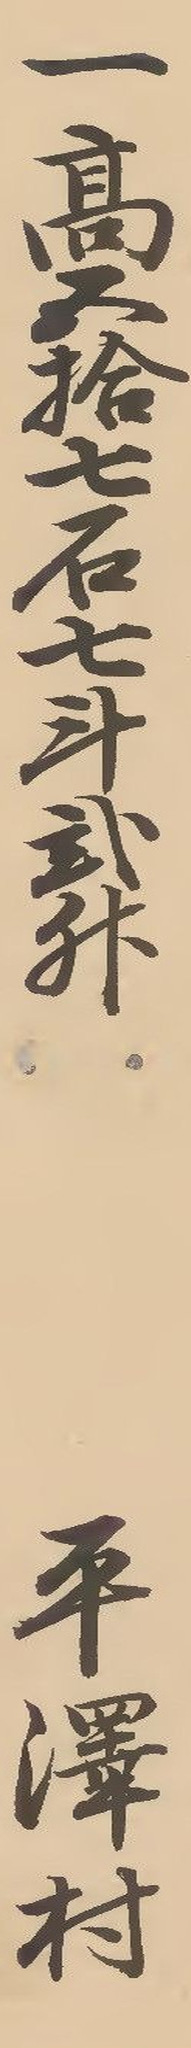一高五拾七石七斗弐升平沢村

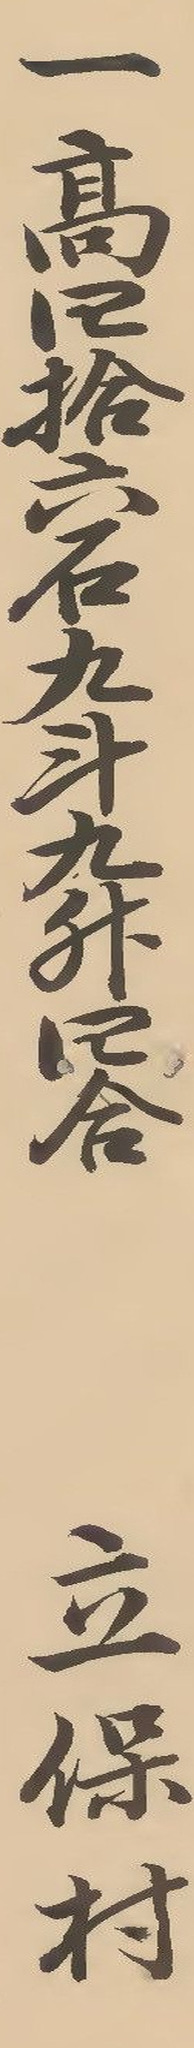一高四拾六石九斗九升四合立保村
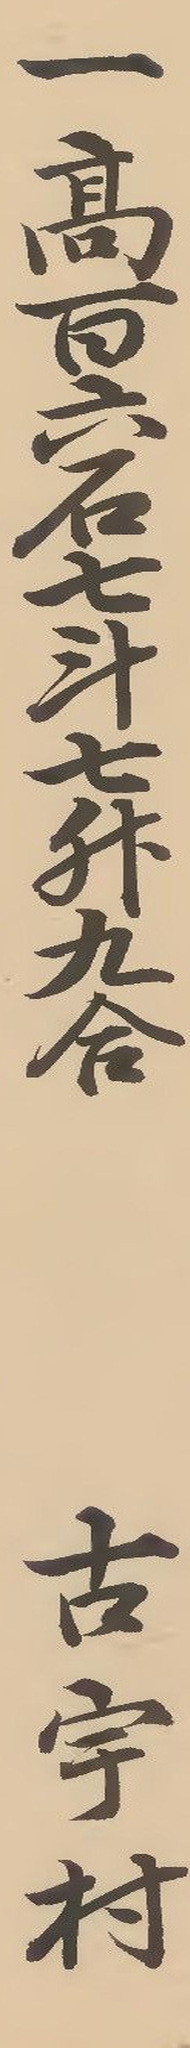一高百六石七斗七升九合古宇村
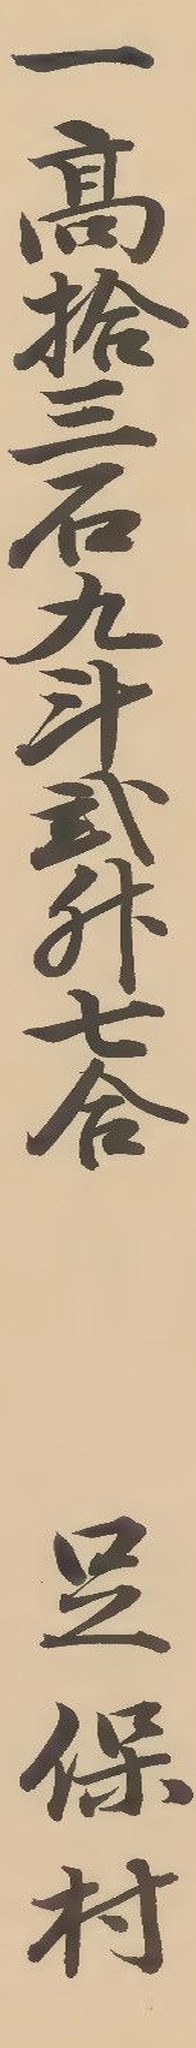一高拾三石九斗弐升七合足保村
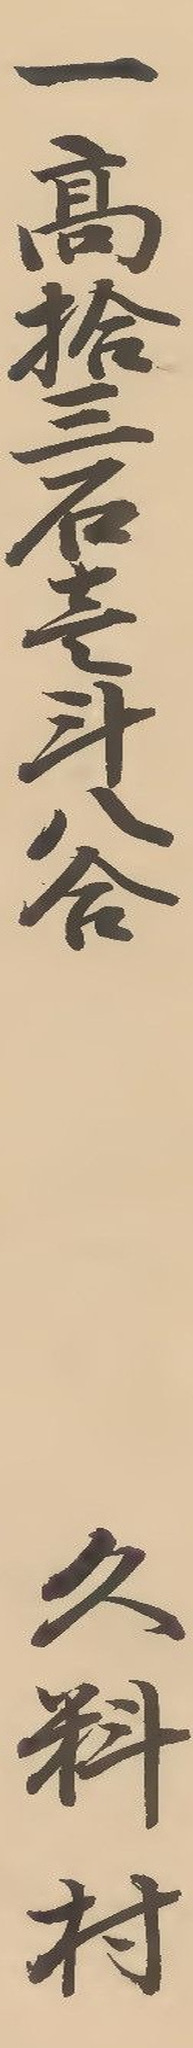一高拾三石壱斗八合久料村
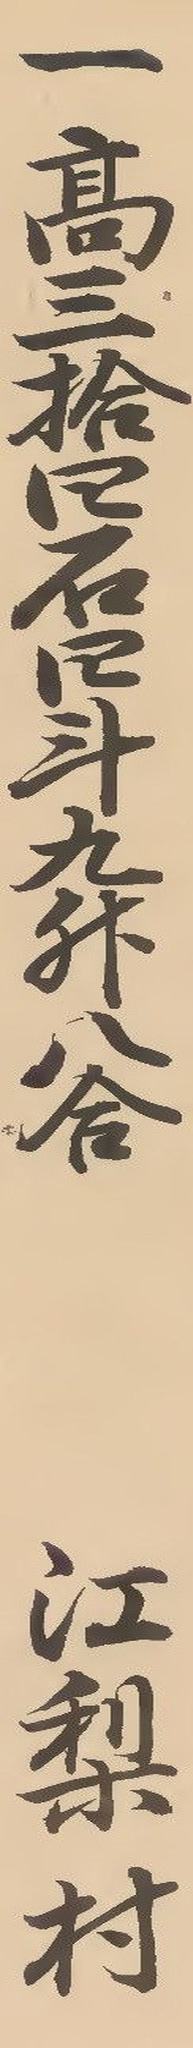一高三拾四石四斗九升八合江梨村
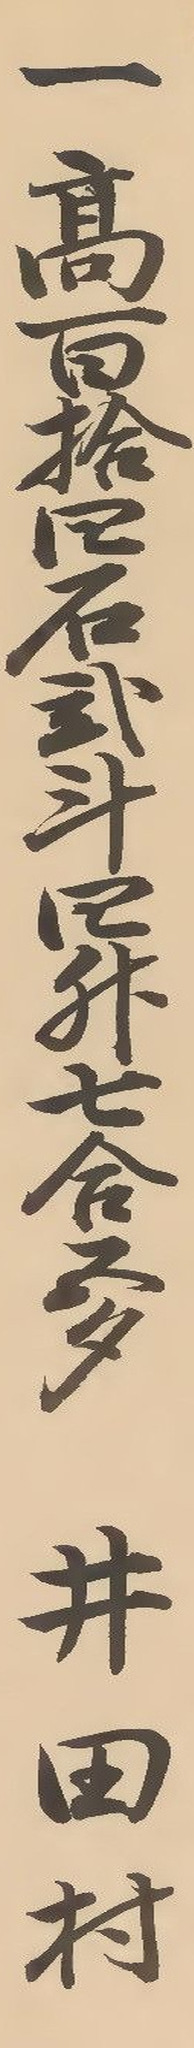一高百拾四石弐斗四升七合五勺井田村
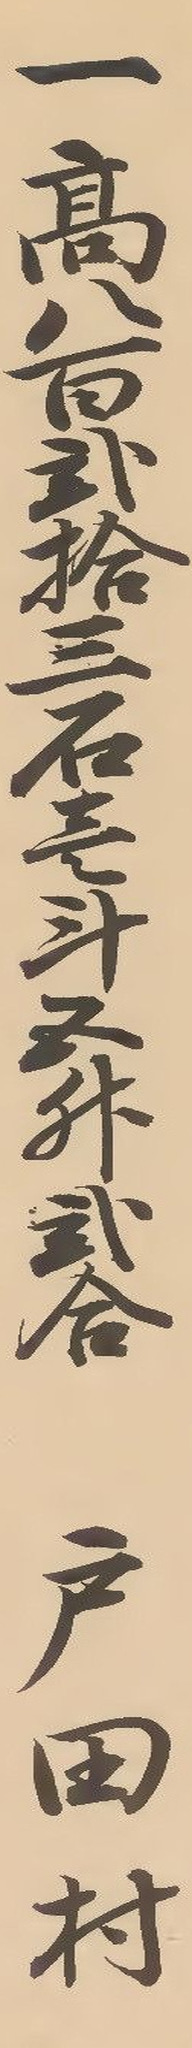一高八百弐拾三石壱斗五升弐合戸田村
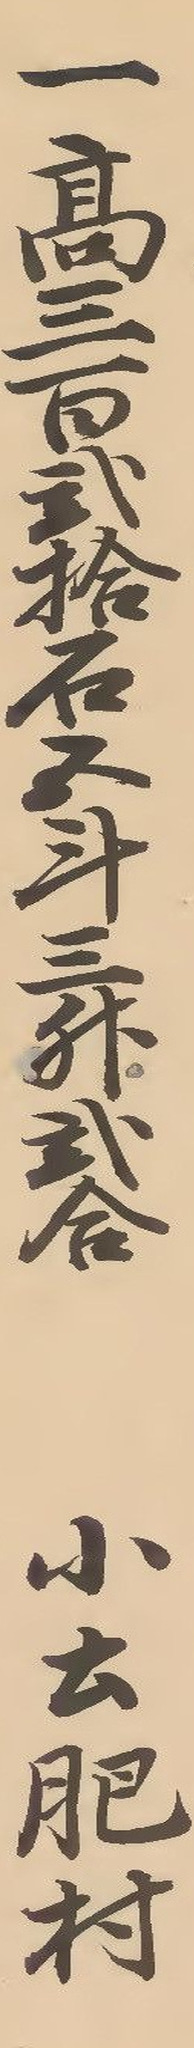一高三百弐拾石五斗三升弐合小土肥村

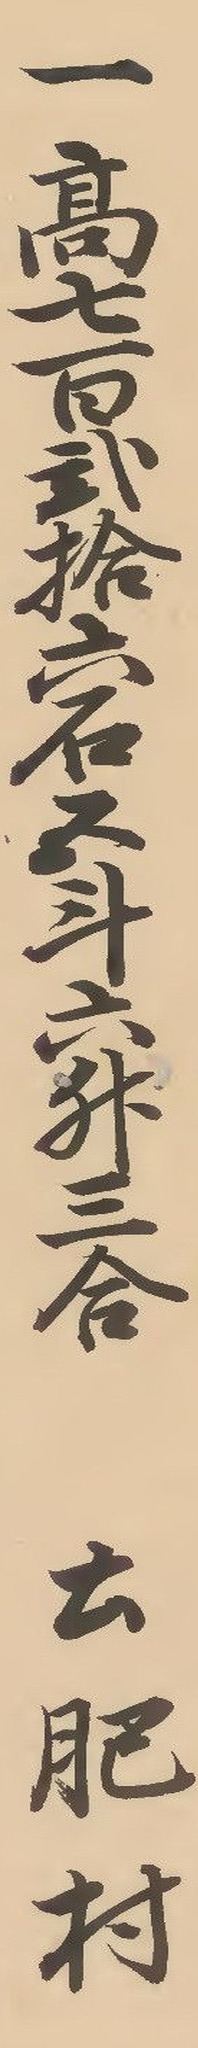一高七百弐拾六石五斗六升三合土肥村
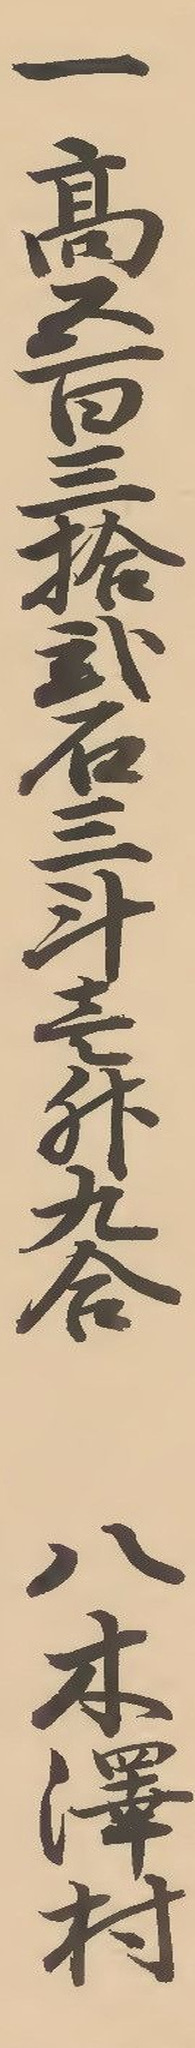一高五百三拾弐石三斗壱升九合八木沢村
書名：伊豆国郷帳
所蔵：国立公文書館 National Archives of Japan
